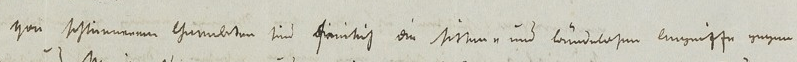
Von schlimmeren Charakter sind freilich die sitten- und würdelosen Angriffe gegen
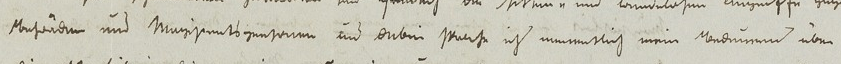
Behörden und Magistratspersonen und dabei spreche ich namentlich mein Bedauern über
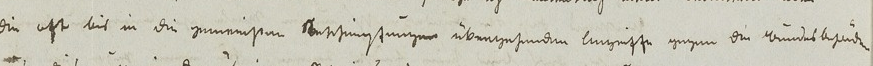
die oft bis in die gemeinsten Beschimpfungen übergehenden Angriffe gegen die Bundesbehörden
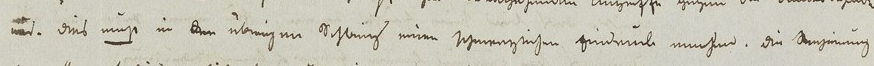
aus. Dies muß in der übrigen Schweiz einen schmerzlichen Eindruck machen. Die Regierung
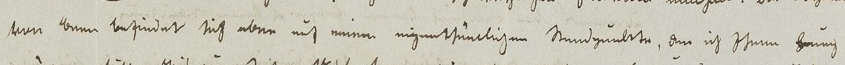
von Bern befindet sich eben auf einem eigenthümlichen Standpunkte, den ich Ihnen kurz
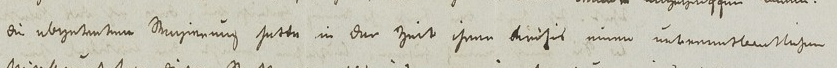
Die abgetretene Regierung hatte in der Zeit ihrer Krisis einen unverantwortlichen
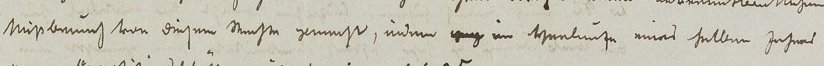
Mißbrauch von diesem Rechte gemacht, indem im Verlaufe eines halben Jahres
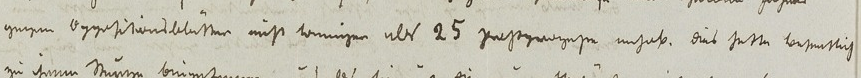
gegen Oppositionsblätter nicht weniger als 25 Preßprozeße anhob. Dies hatte wesentlich
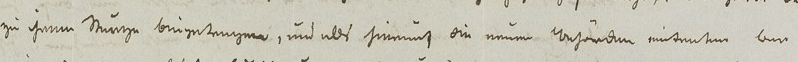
zu ihrem Sturze beigetragen, und als hierauf die neuen Behörden eintraten war
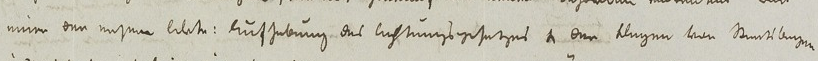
einer der ersten Akte: Aufhebung des Achtungsgesetzes & der Klagen von Staatswegen
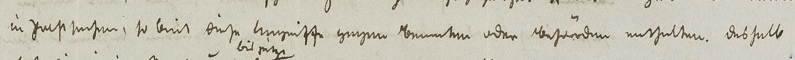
in Preßsachen, so weit diese Angriffe gegen Beamten oder Behörden enthalten. Deshalb
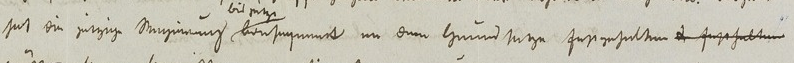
hat die jetzige Regierung bis jetzt konsequent an dem Grundsatze festgehalten, & festhalten
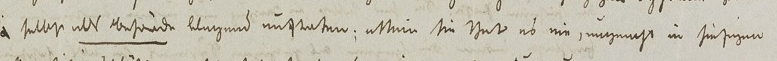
selbst als Behörde klagend auftreten; allein sie thut es nie, ungeacht in hiesigen
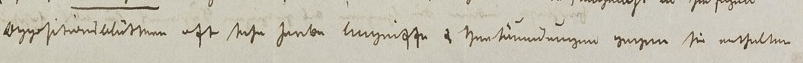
Oppositionsblättern oft sehr herbe Angriffe & Verläumdungen gegen sie enthalten
